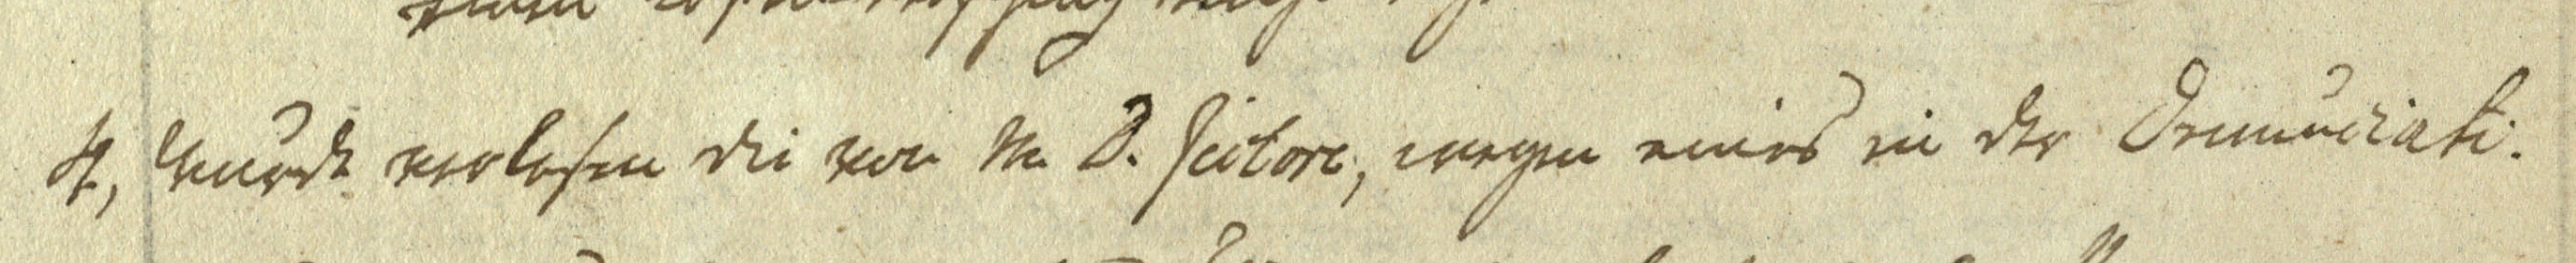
4., Wurde verlesen die von M. D. Rectore, wegen eines in der Denunciati¬
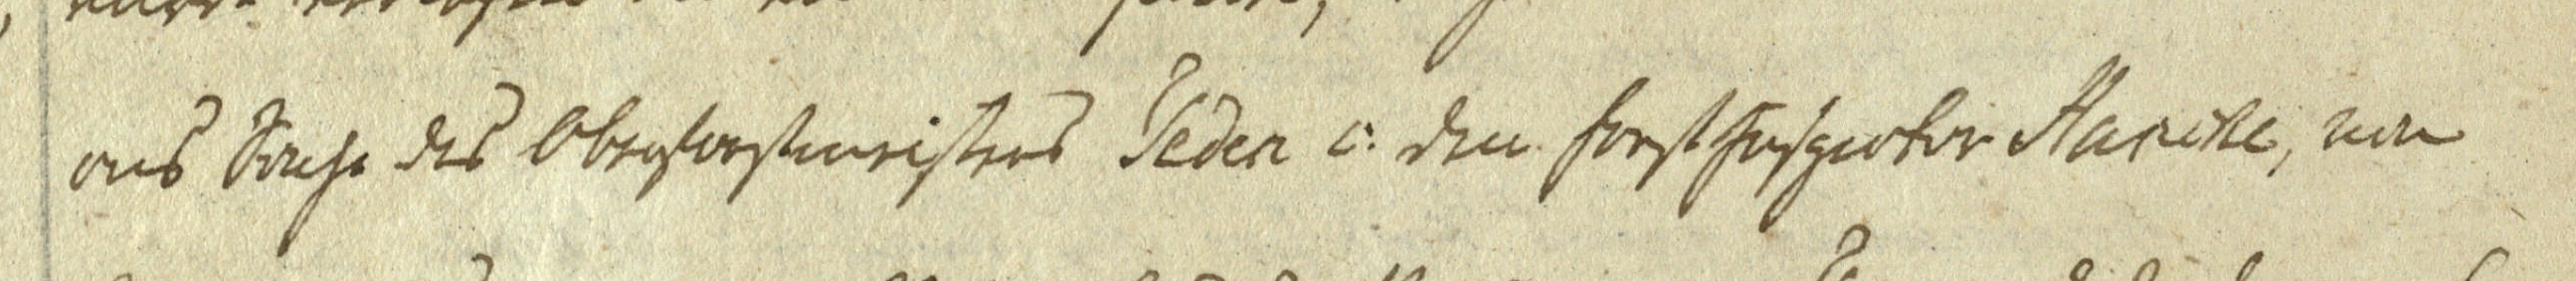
ons Sache des Oberforstmeisters Teden c. den ForstInspector Hancke, von
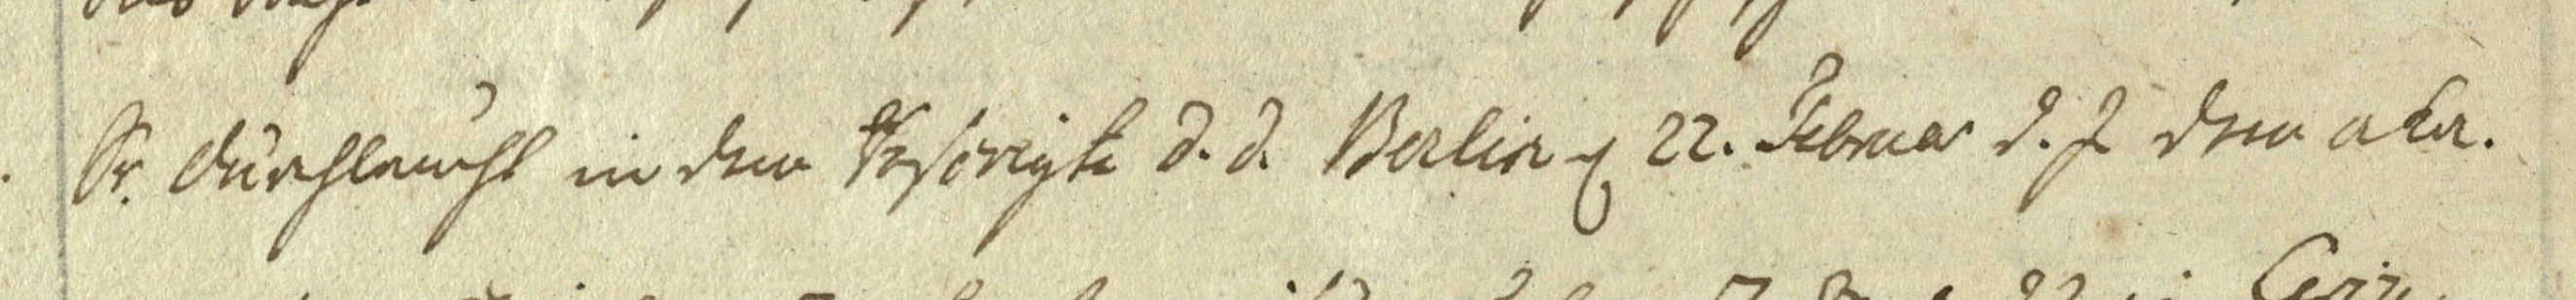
Sr. Durchlaucht in dem Rescripte d. d. Berlin 22. Februar d. J. dem aka¬
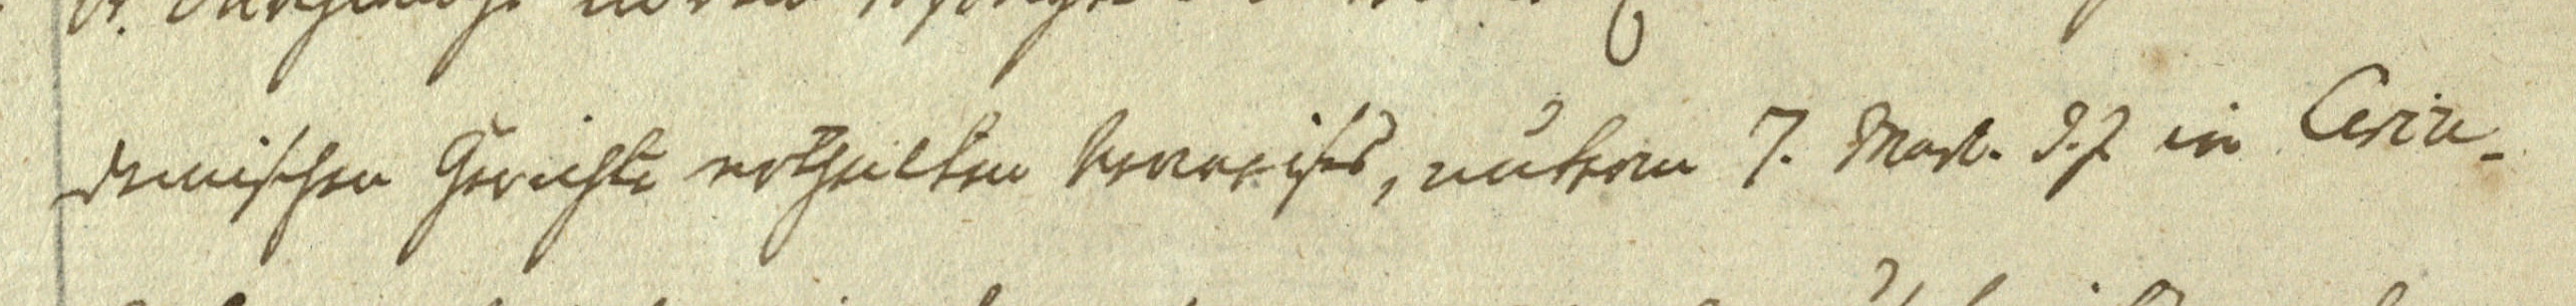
demischen Gerichte ertheilten Verweises, unterm 7. Mart. d. J. in Circu¬
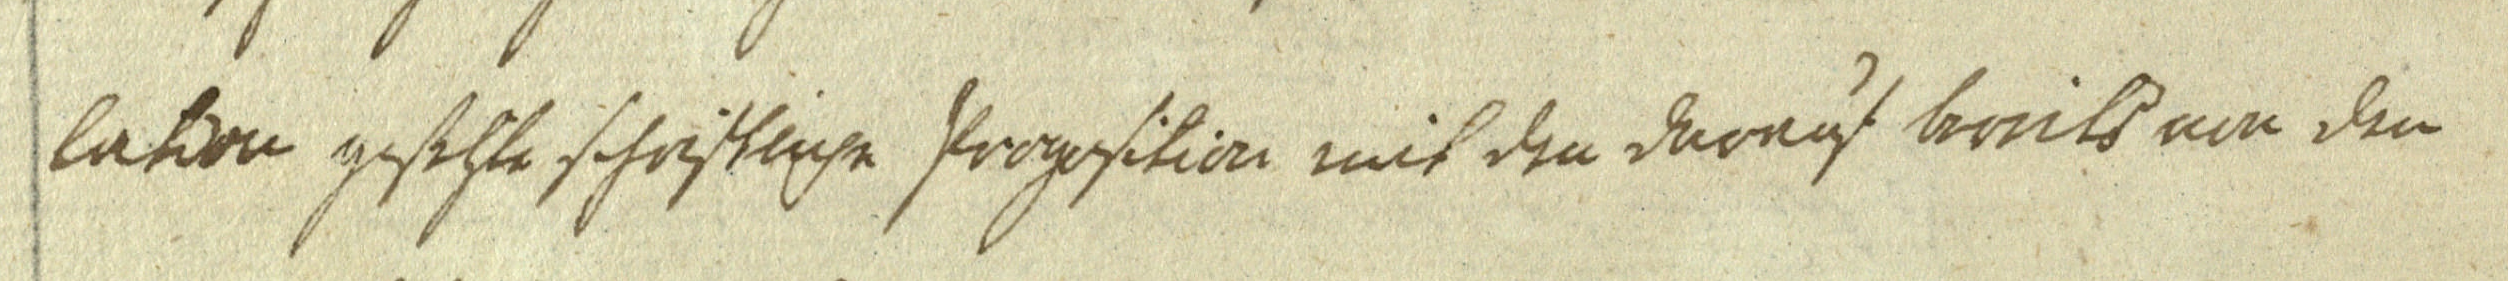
lation gesetzte schriftliche Proposition mit den darauf bereits vom den
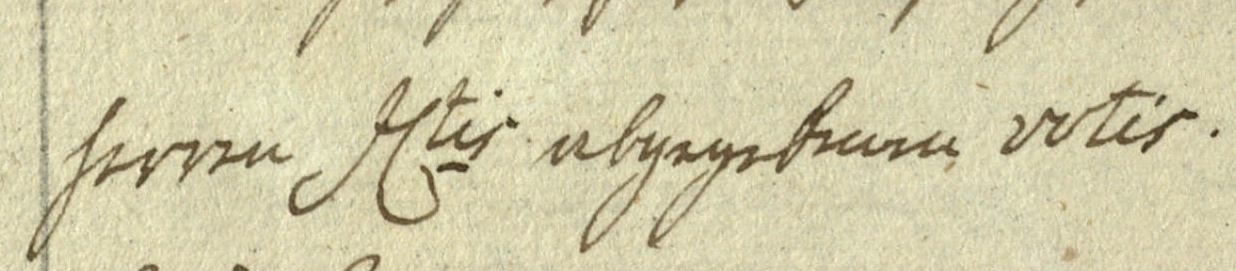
Herren Iltis. abgegebenen votis.
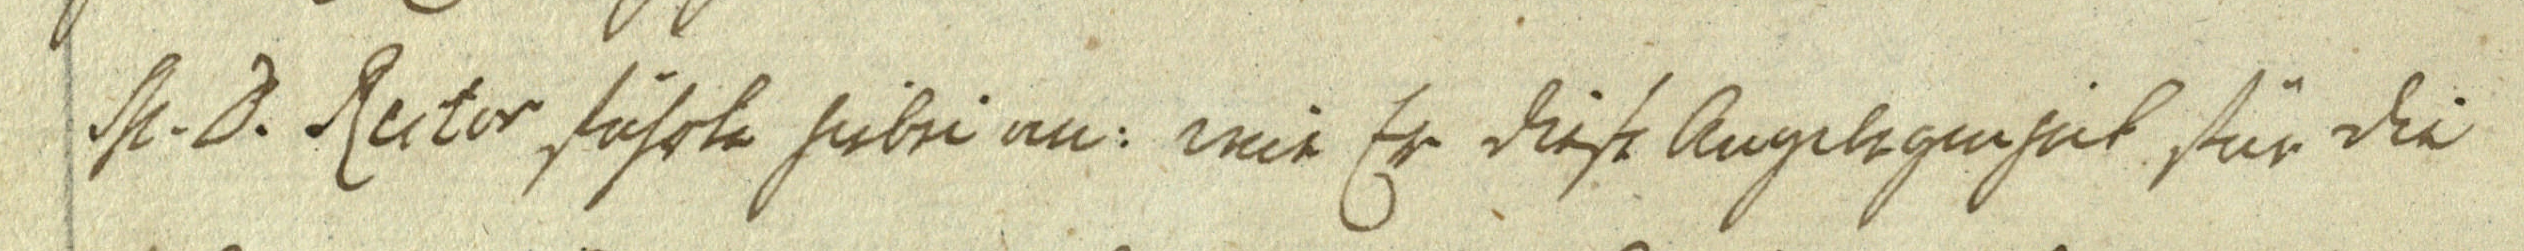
M. D. Rector führte hiebei an: wie Er diese Angelegenheit für die
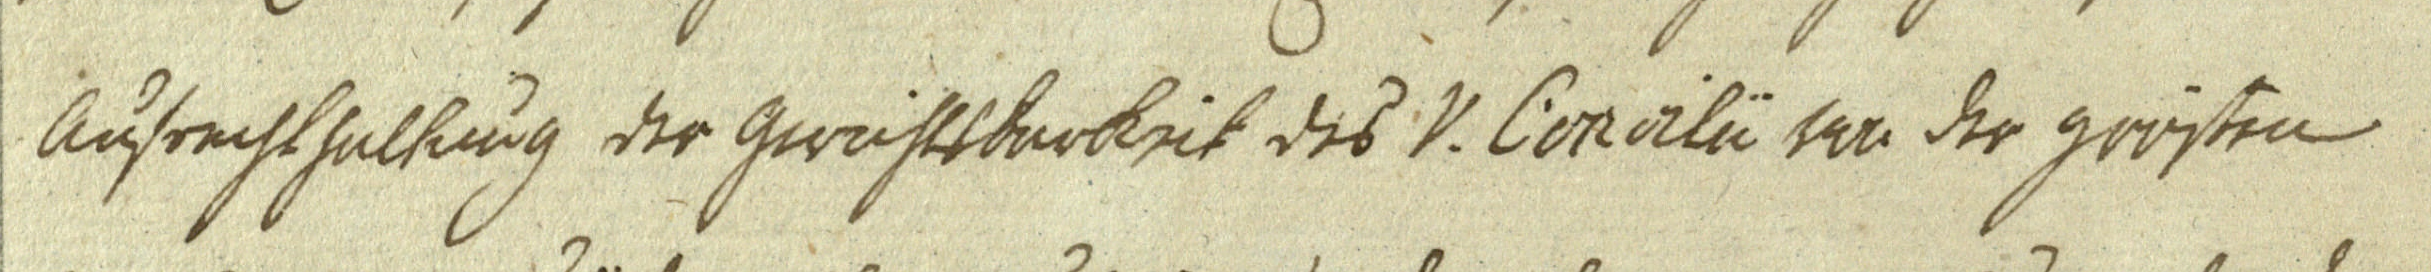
Aufrechthaltung der Gerichtsbarkeit des V. Concilii von der grösten
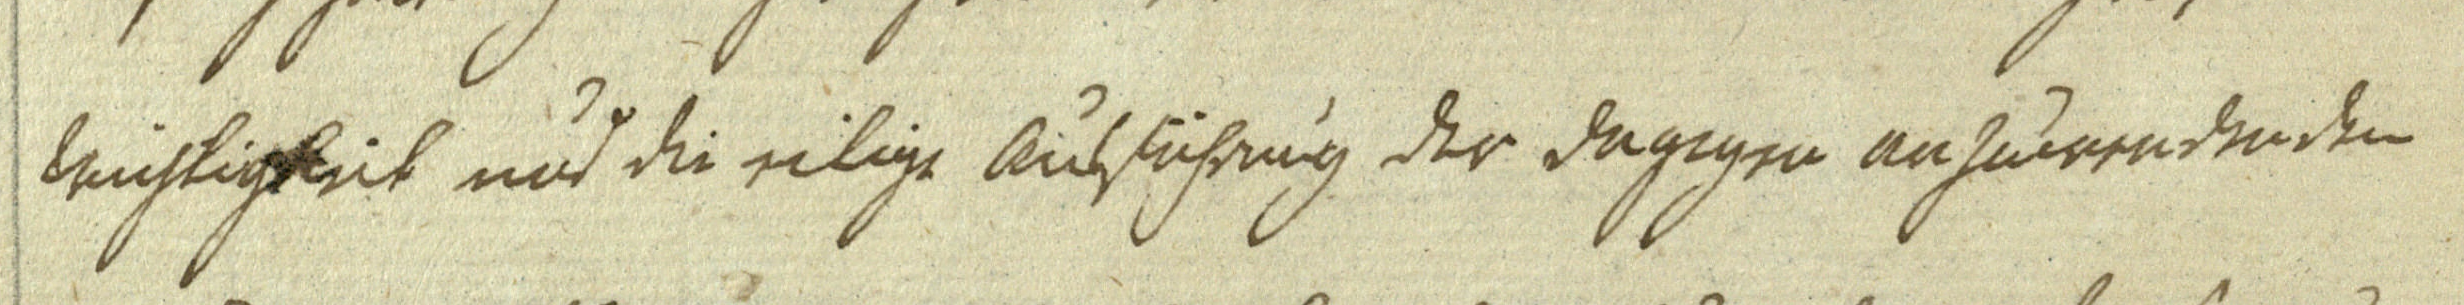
Wichtigkeit und die eilige Ausführung der dagegen an zuwendenden
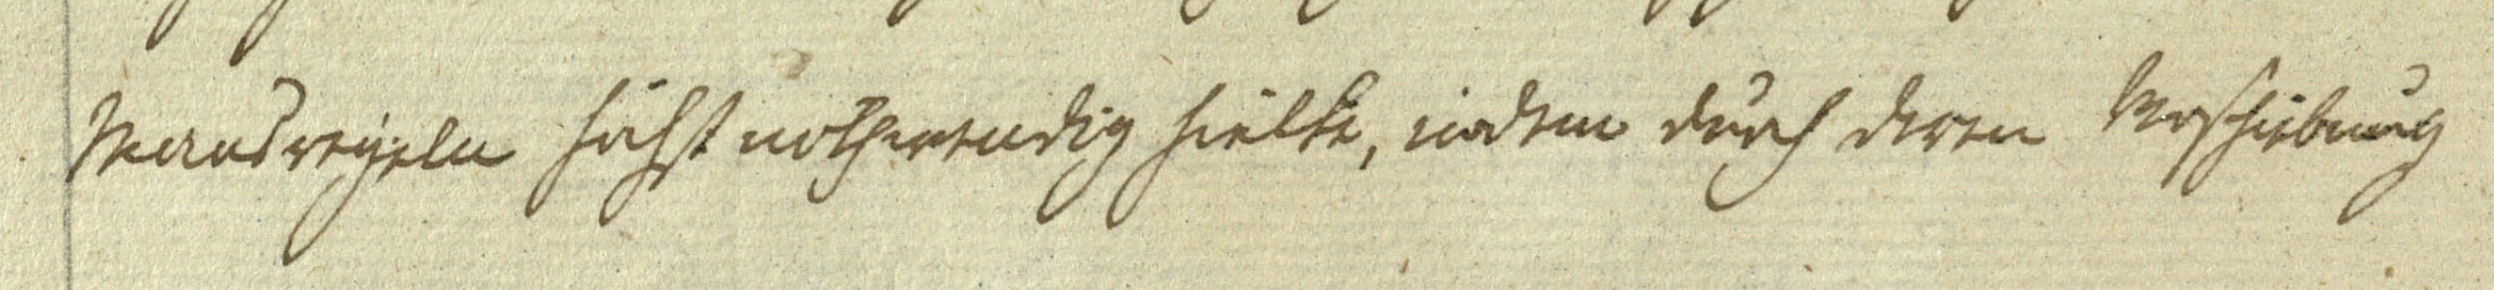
Maasregeln höchst nothwendig hielte, indem durch deren Verschiebung
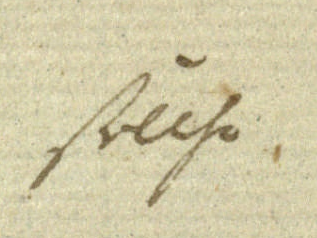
solche,
